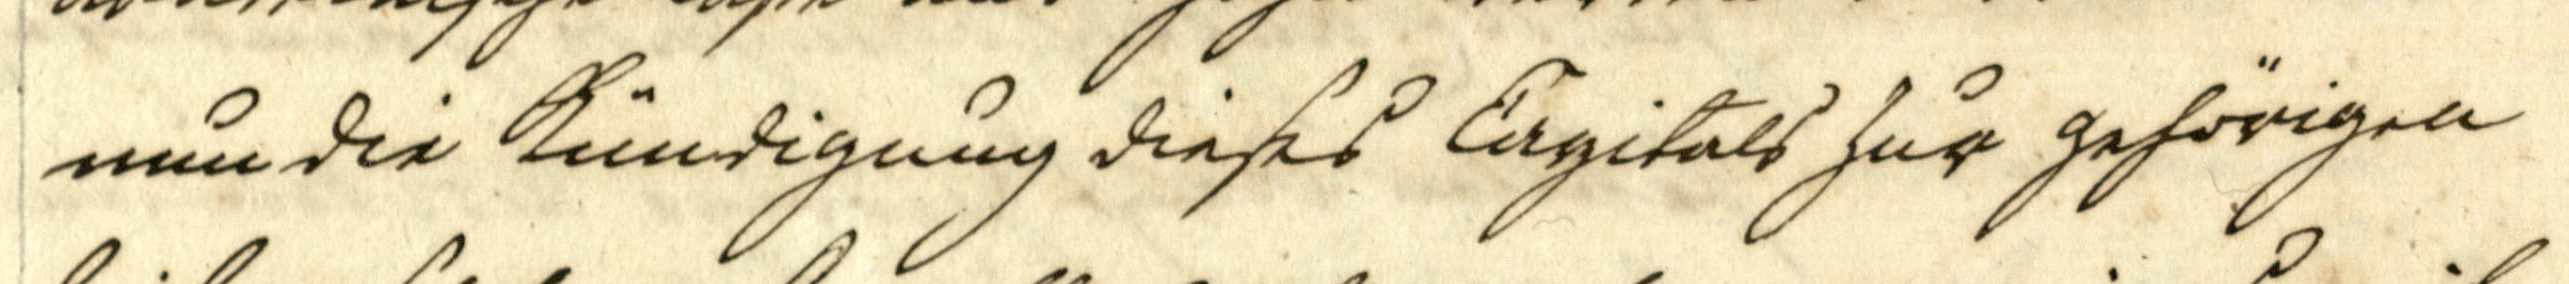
nun die Kündigung dieses Capitals zur gehörigen
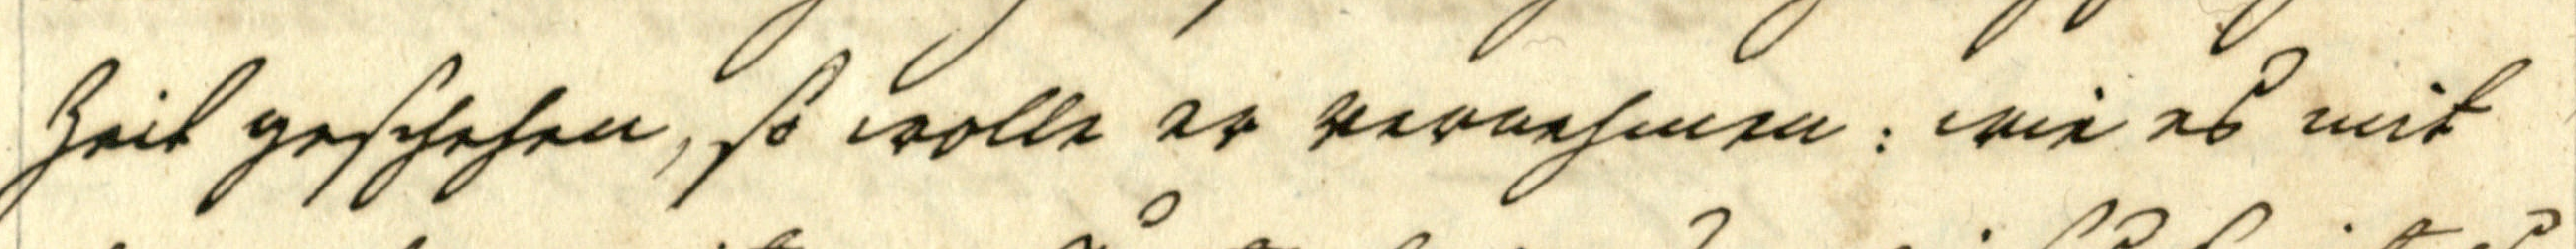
Zeit geschehen, so wolle er vernehmen: wie es mit
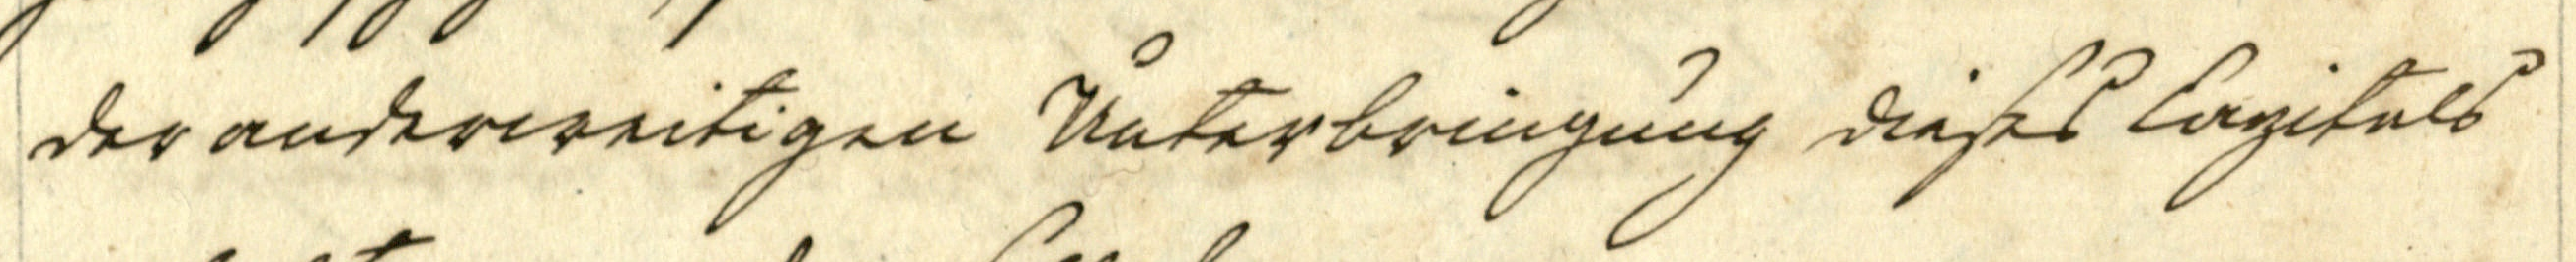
der anderweitigen Unterbringung dieses Capitals
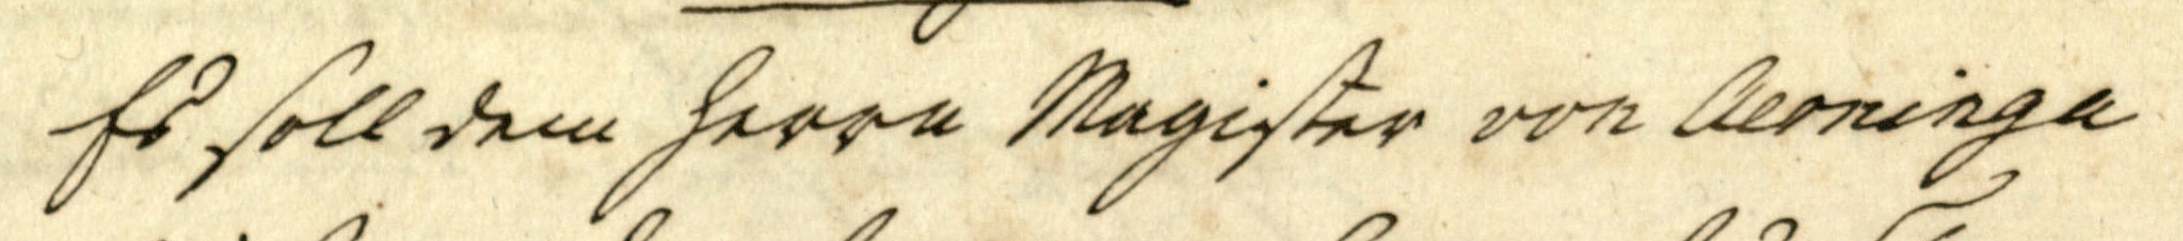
Es soll dem Herrn Magister von Aeminga
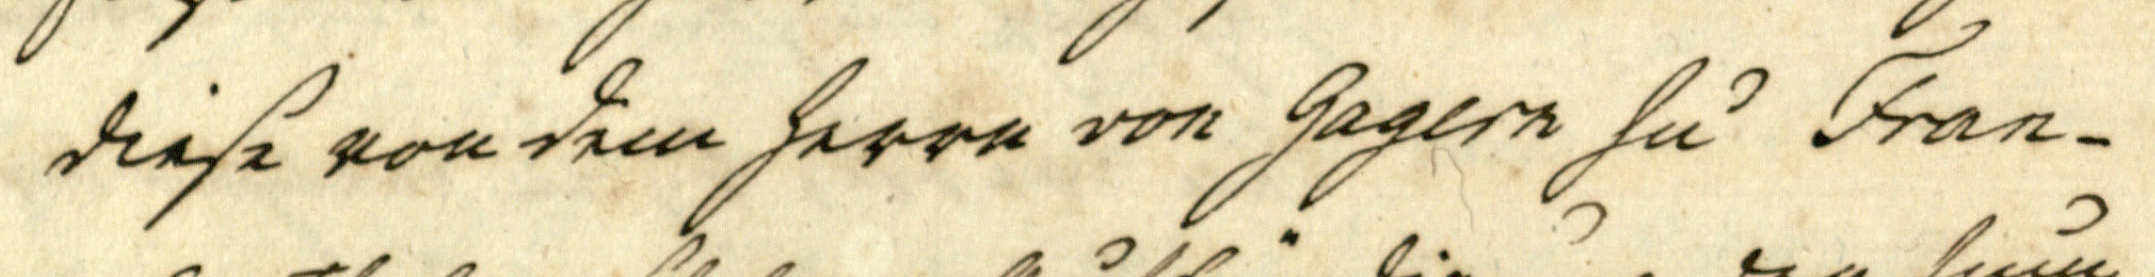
diese von dem Herrn von Gagern zu Fran¬
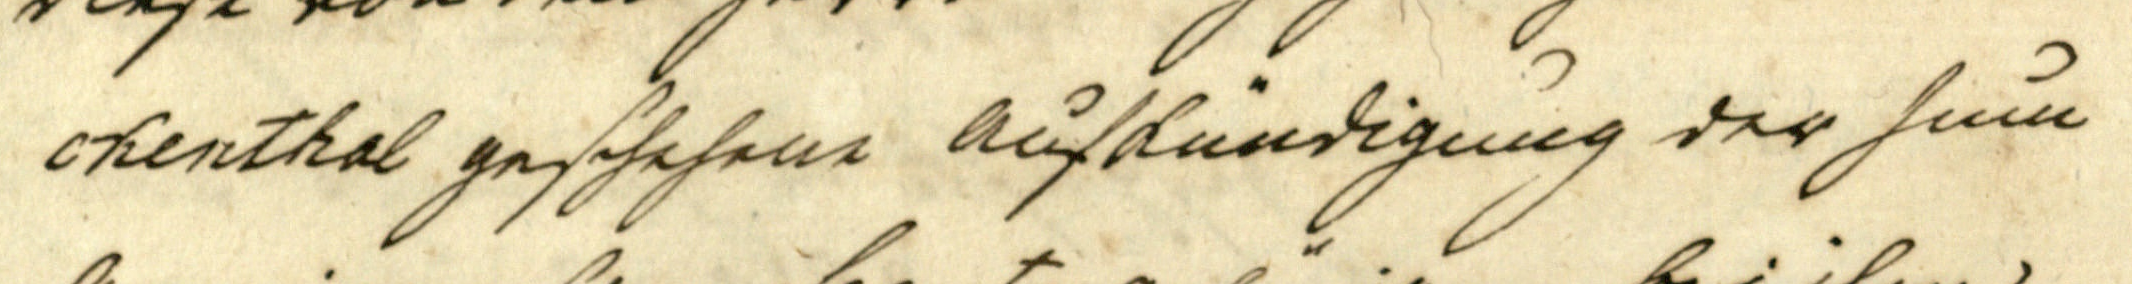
ckenthal geschehene Aufkündigung der zum
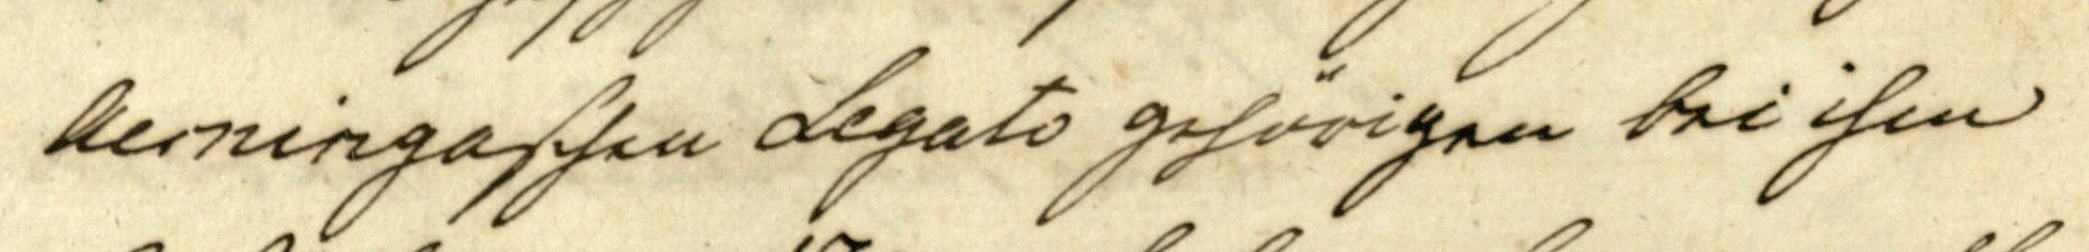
Aemingaschen Legato gehörigen bei ihm
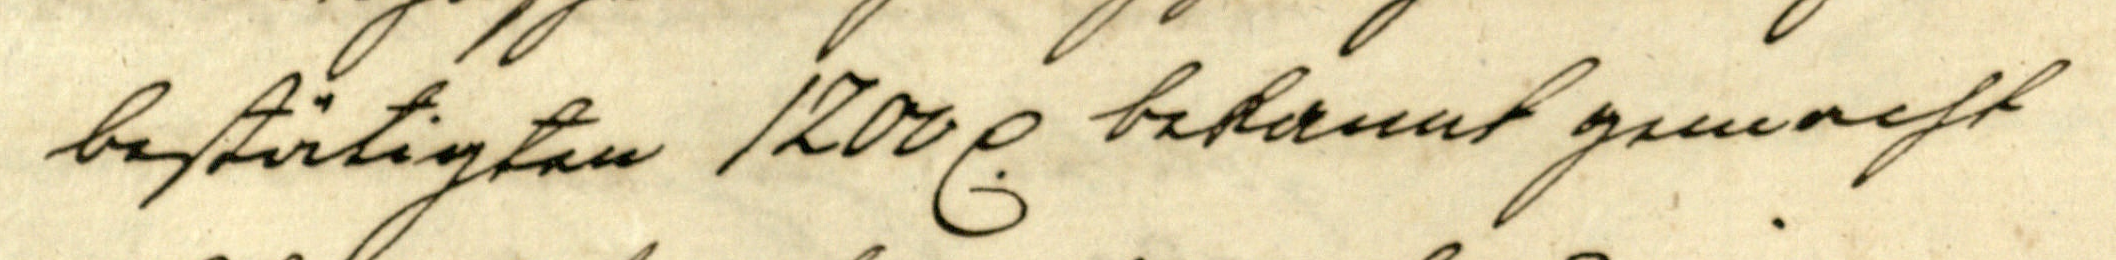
bestätigten 1200 l. bekannt gemacht
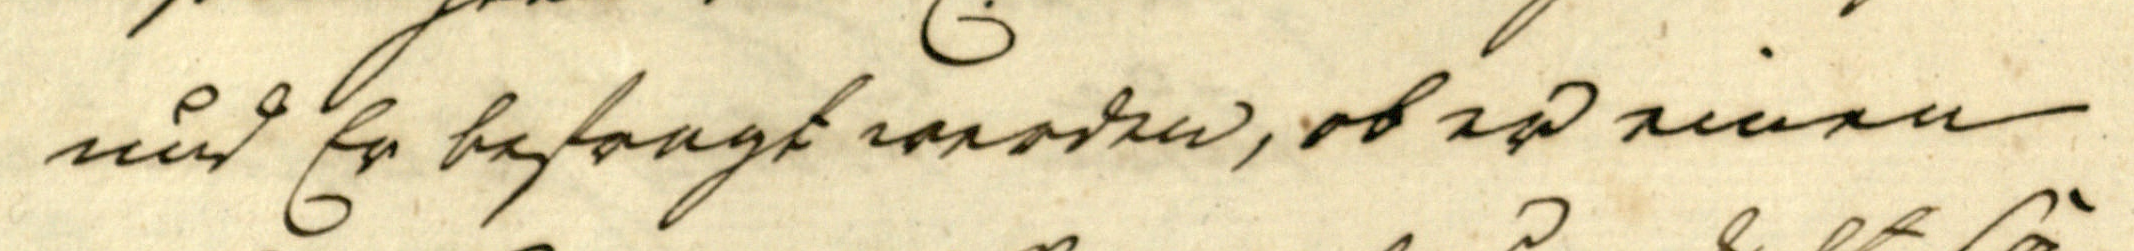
und Er befragt werden, ob er einen
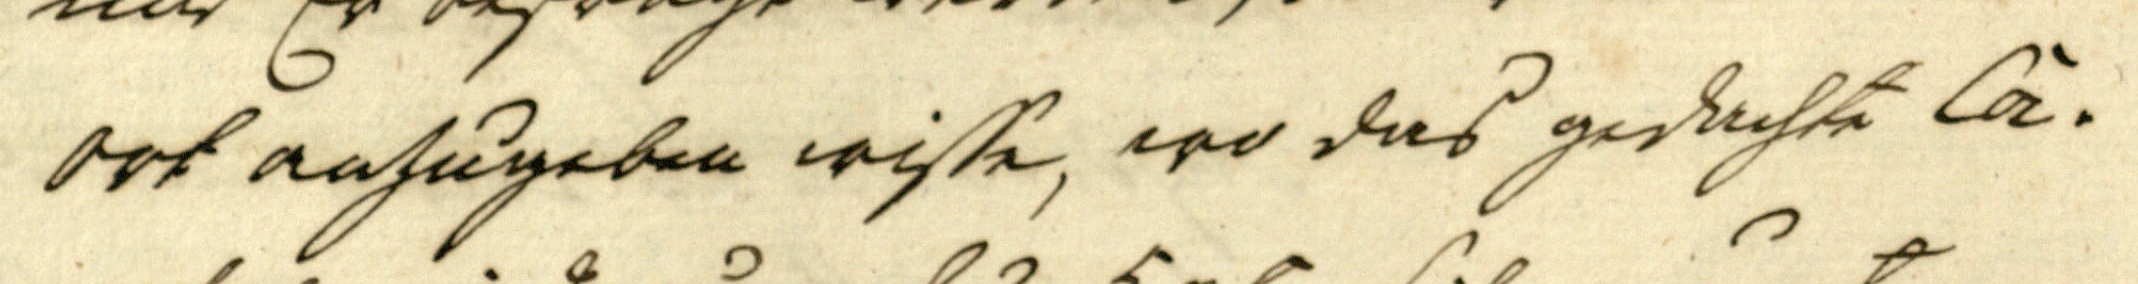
Ort anzugeben wisse, wo das gedachte Ca¬
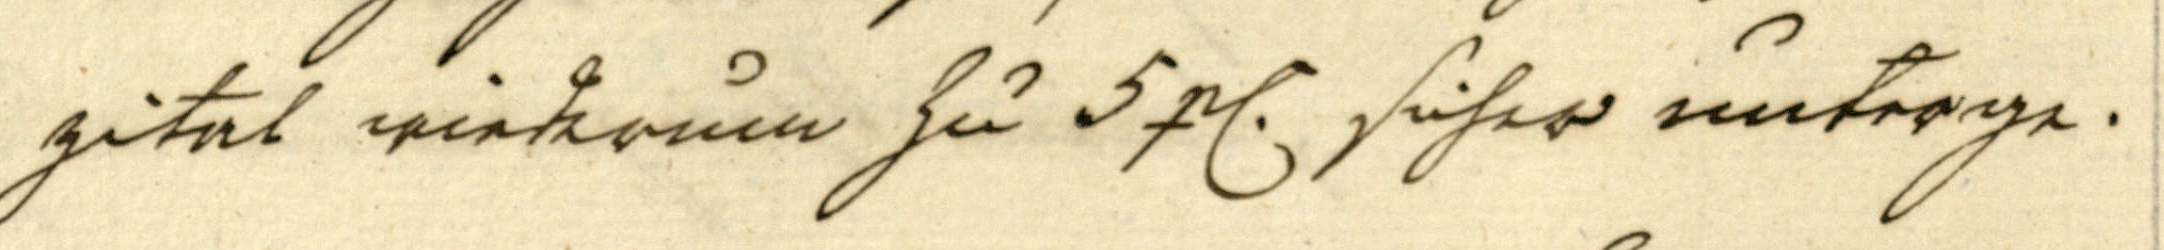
pital wiederum zu 5 pl. so sicher unterge¬
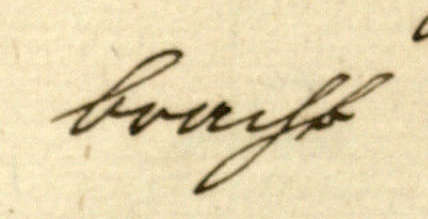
bracht
